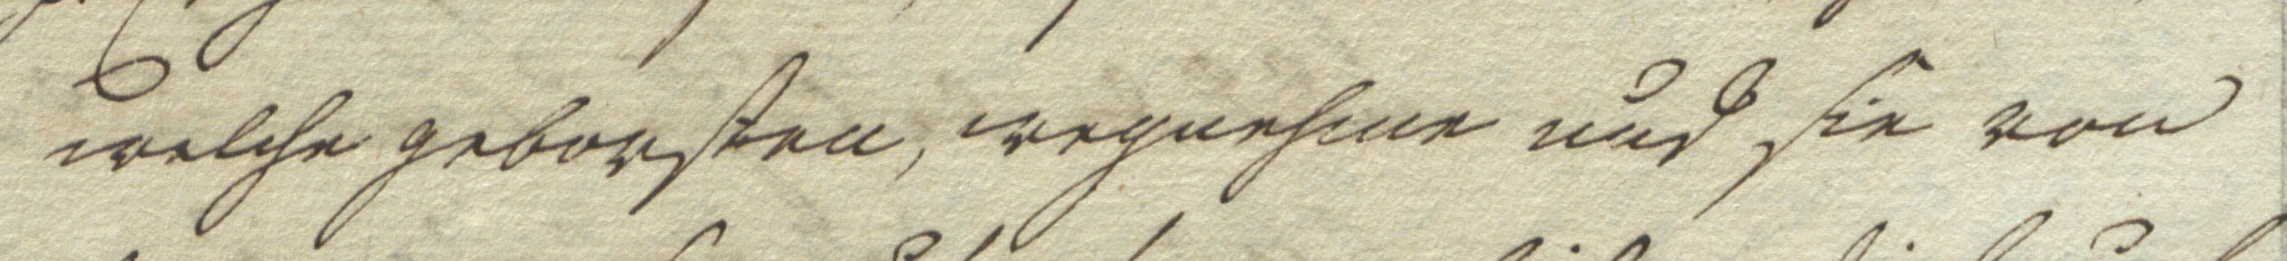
welche geborsten, wegnehme und sie von
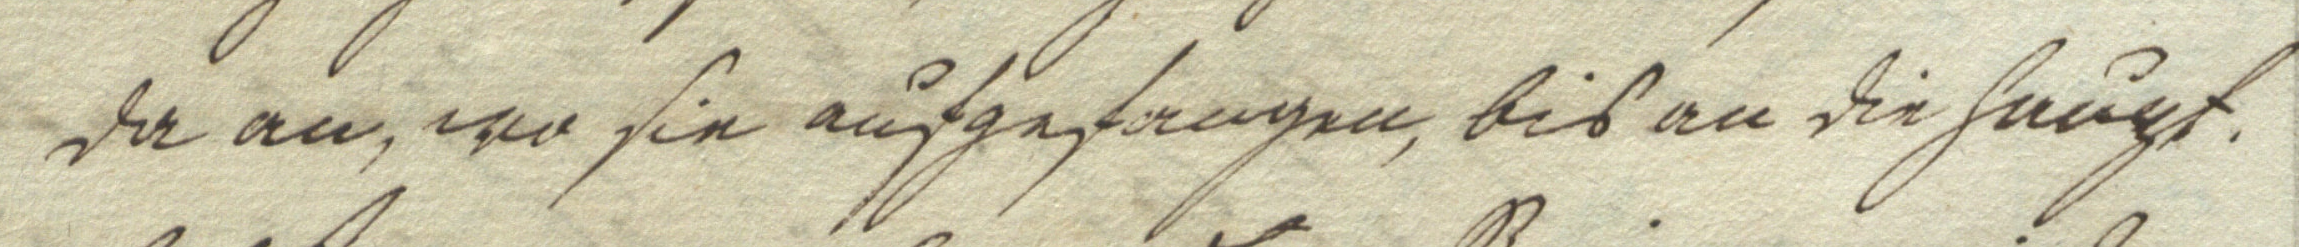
da an, wo sie aufgefangen, bis an die Haupt¬
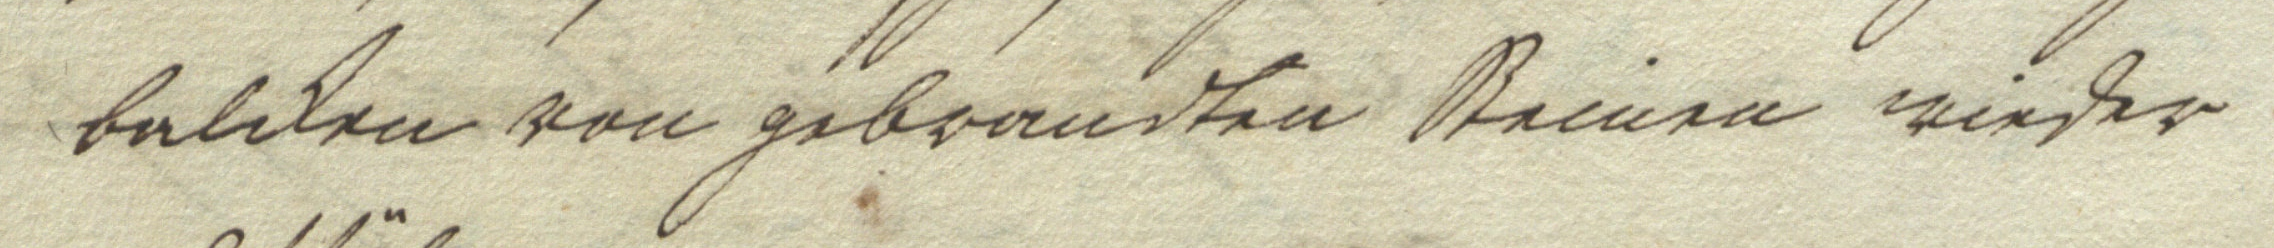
balcken von gebrandten Steinen wieder
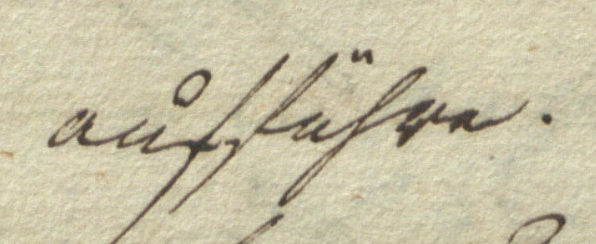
aufführe.
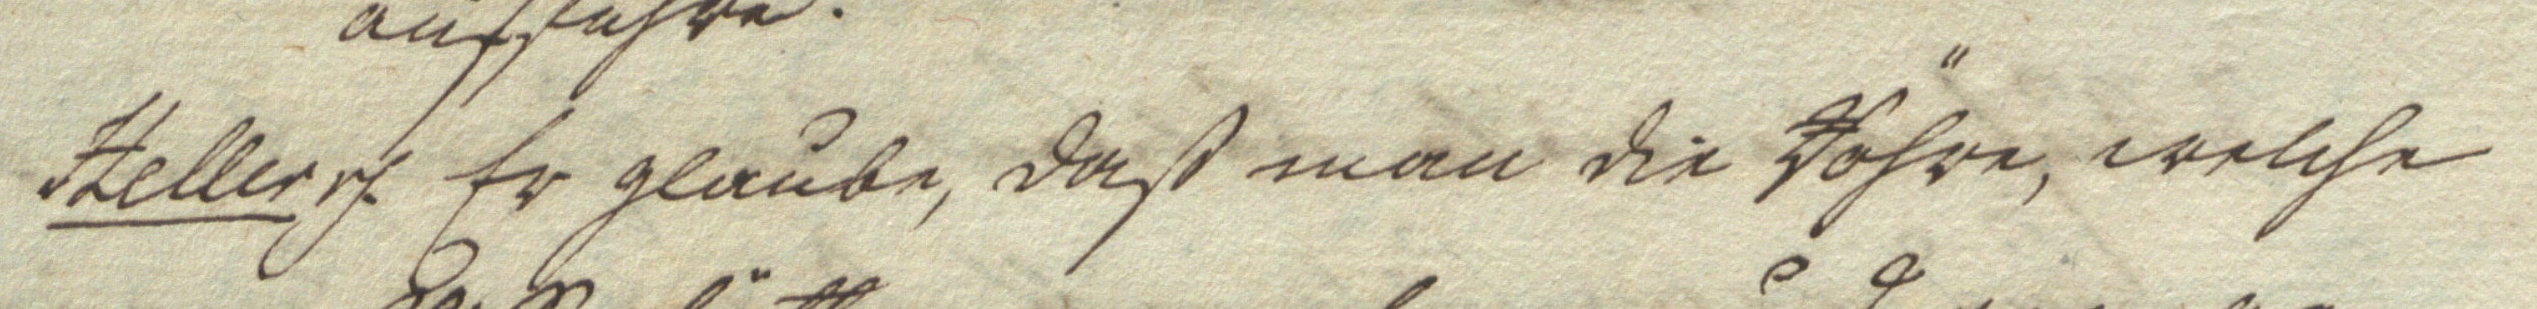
Heller rf. Er glaube, daß man die Röhre, welche
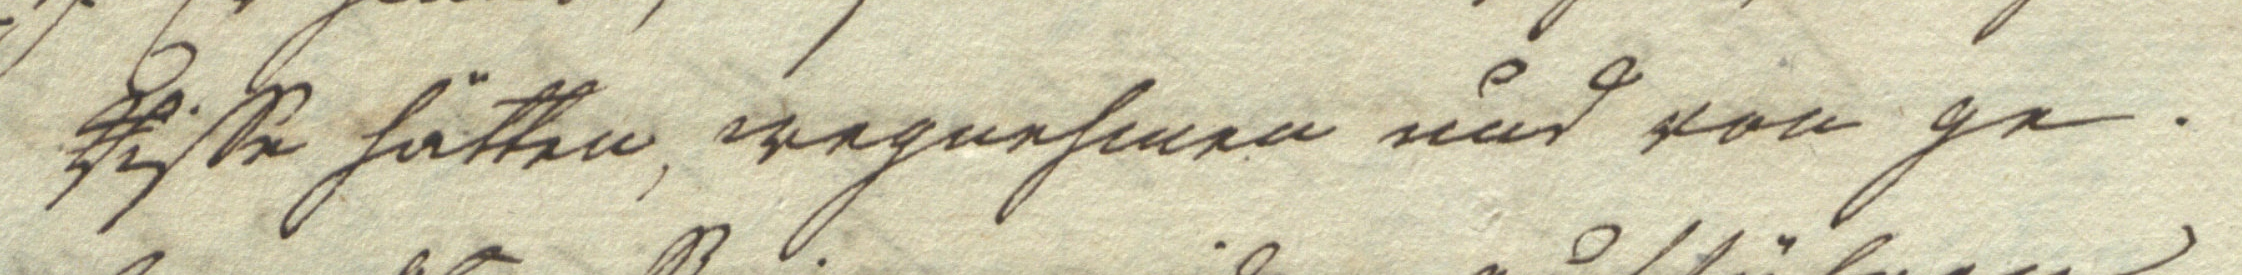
Risse hätten, wegnehmen und von ge¬
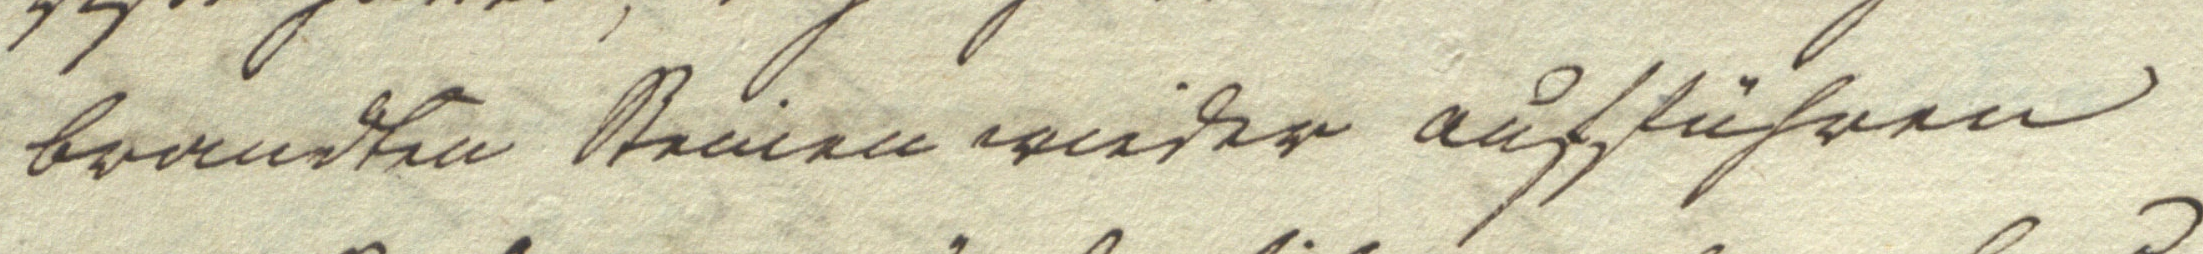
brandten Steinen wieder aufführen
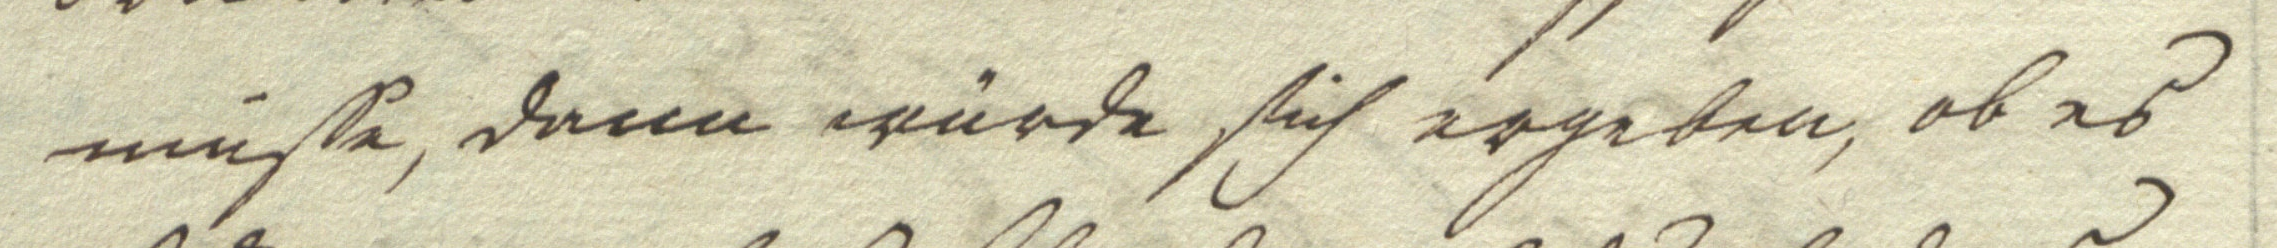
müsse, dann würde sich ergeben, ob es
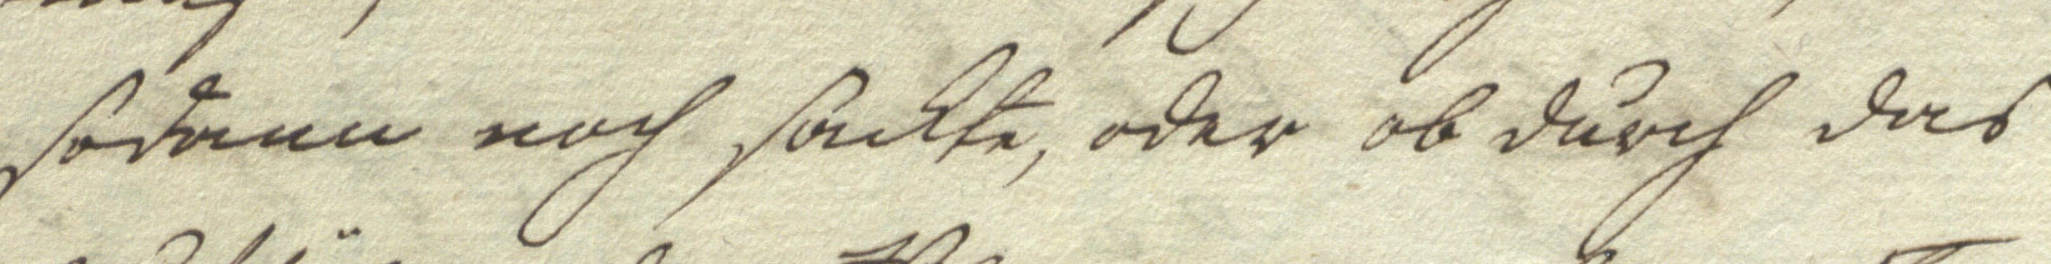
sodann noch sackte, oder ob durch das
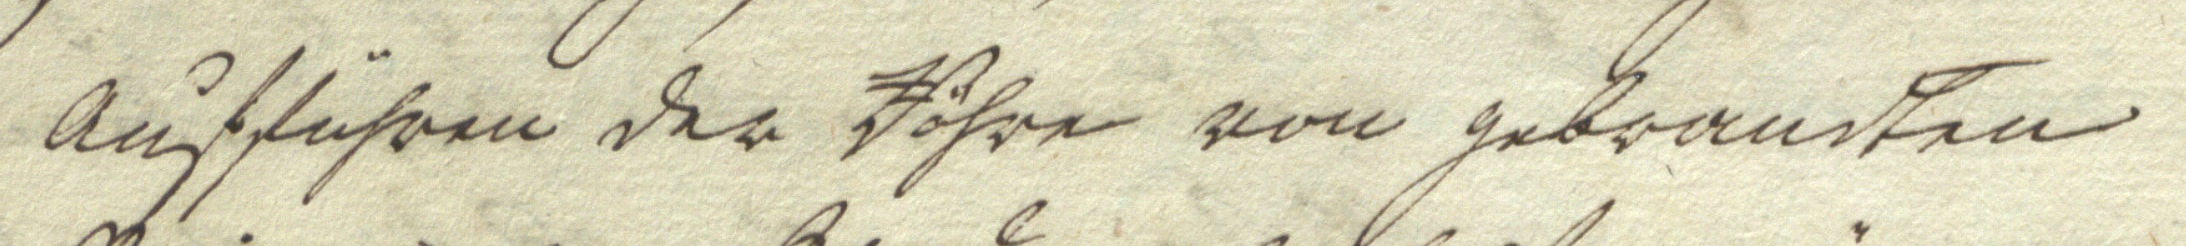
Aufführen der Röhre von gebrandten
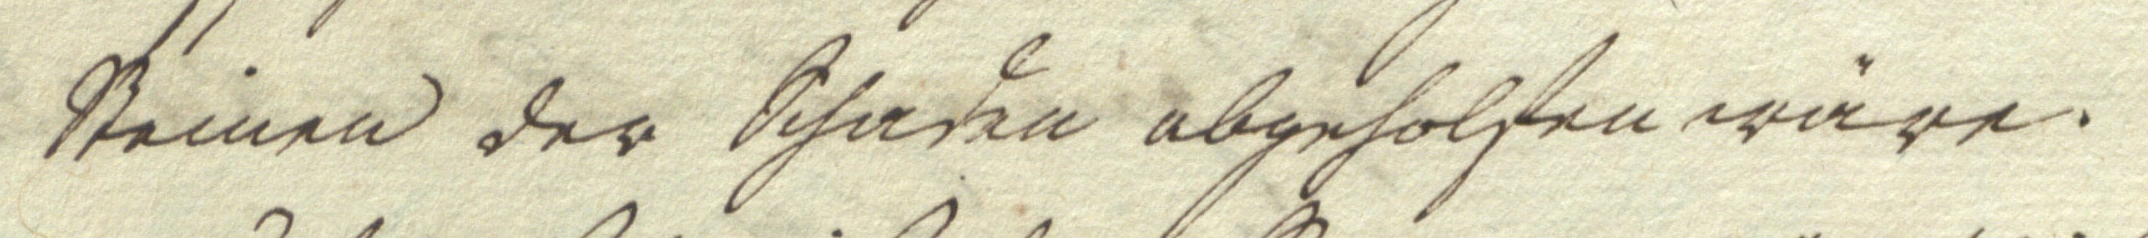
Steinen der Schaden abgeholfen wäre.
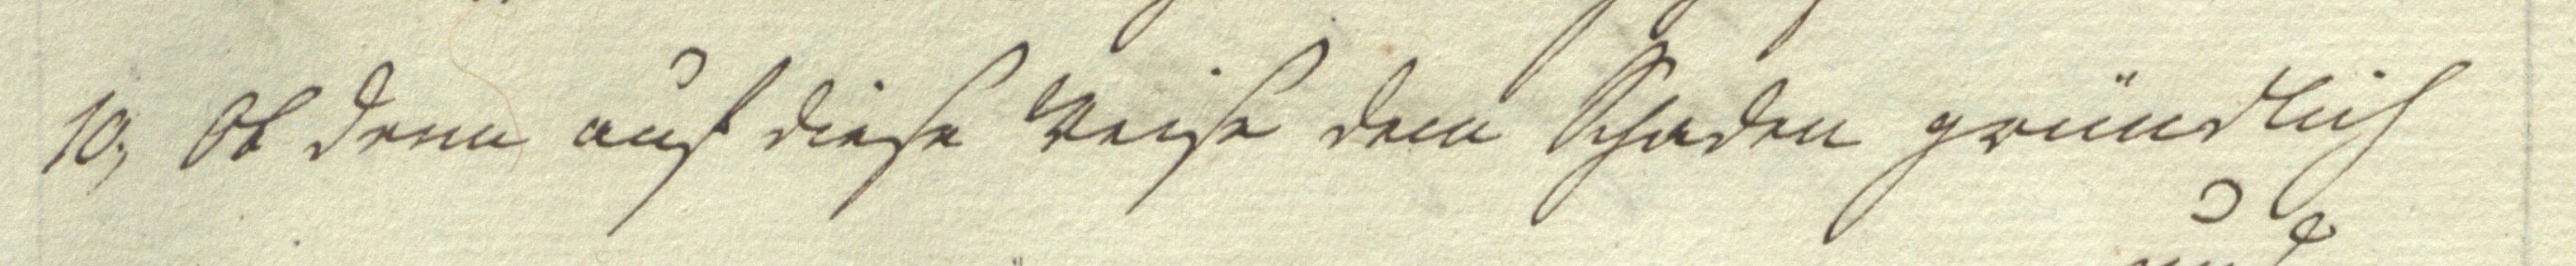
10., Ob denn auf diese Weise dem Schaden gründlich
